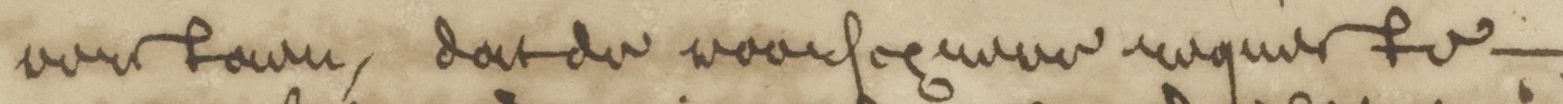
verstaen, dat de voorschreve requeste —
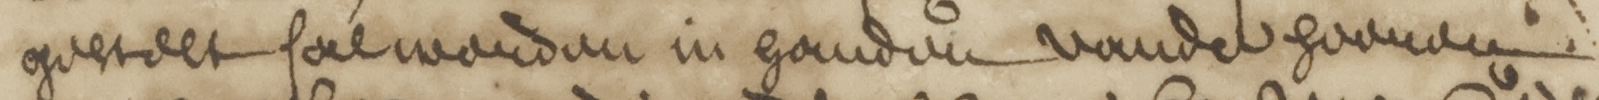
gestelt sal werden in handen vande heeren
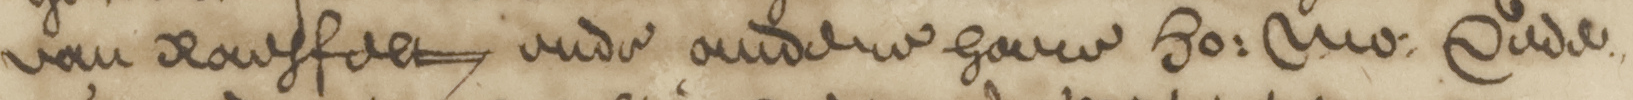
van Raesfelt, ende andere hare Ho:Mo: Gede„
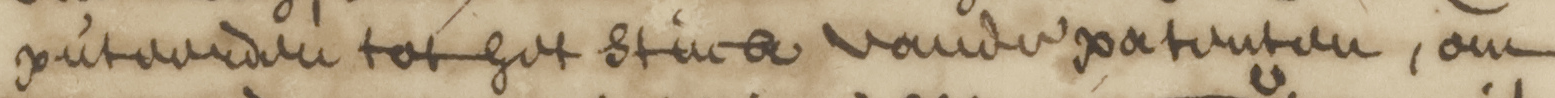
,,puteerden tot het stuck vande patenten, om
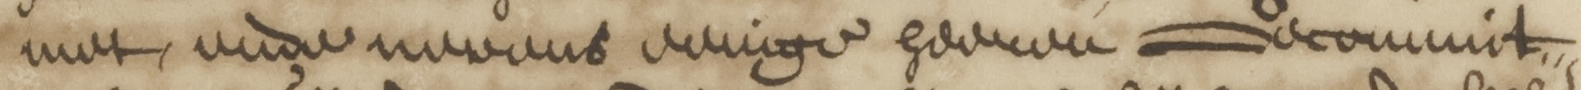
met, ende nevens eenige heeren Gecommit„
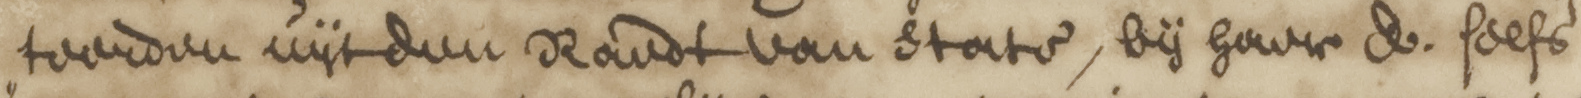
,,teerden uijt den Raedt van State, bij haer E. selfs
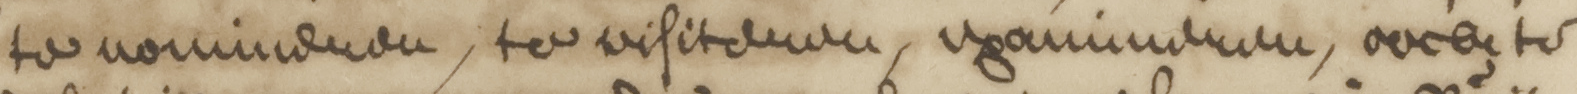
te nomineren, te visiteren, examineren, oock te
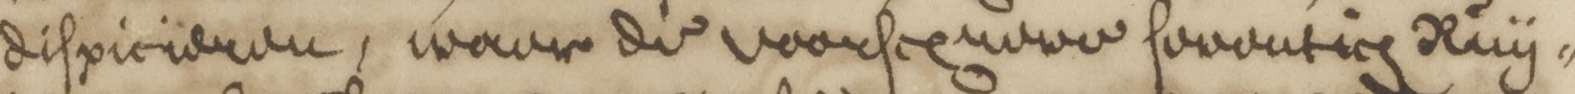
dispicieren, waer de voorschreve seventich duij„
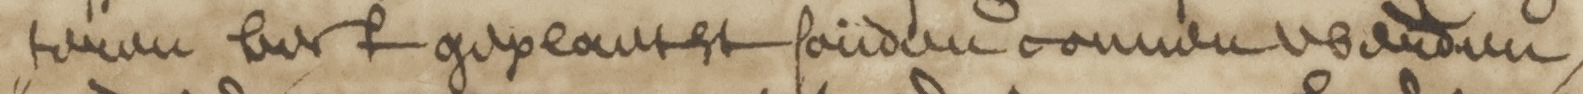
teren best geplaetst souden connen werden
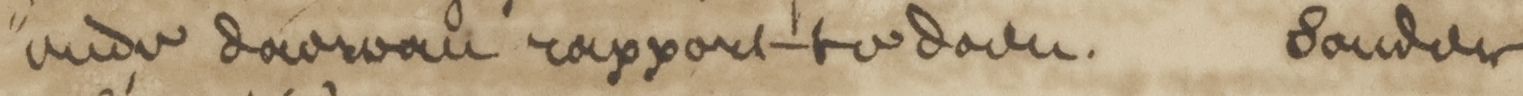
ende daervan rapport te doen. sonder
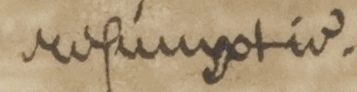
resumptie.
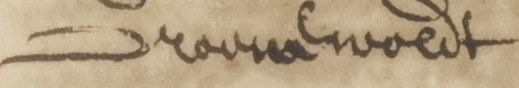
Groenwoldt
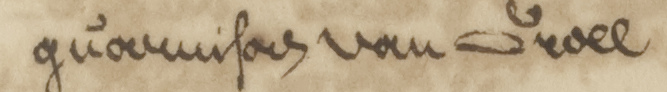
guarnisoen van Grell
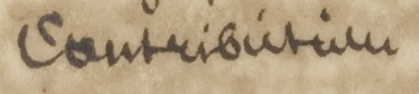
Contributien
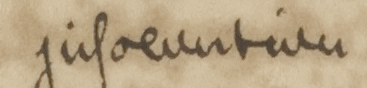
insolentien
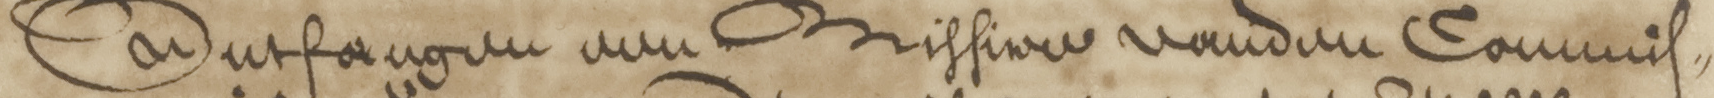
Ontfangen een Missive vanden Commis„
